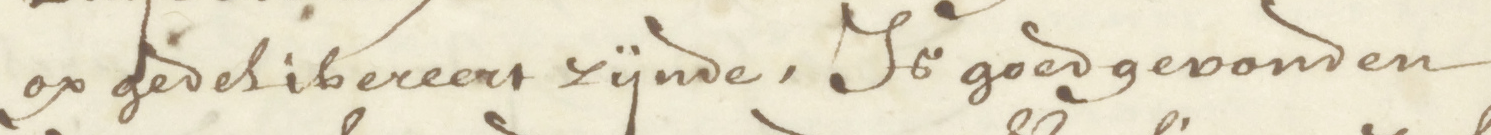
op gedelibereert zijnde, Is goedgevonden
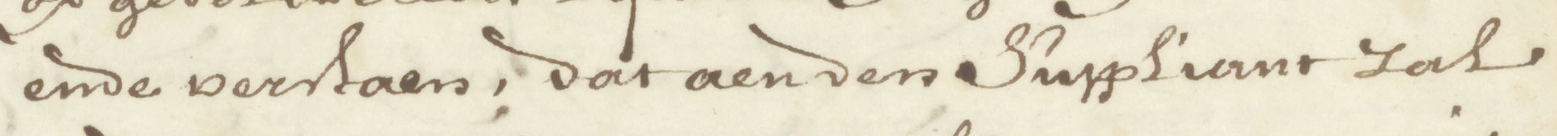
ende verstaen, dat aen den Suppliant zal
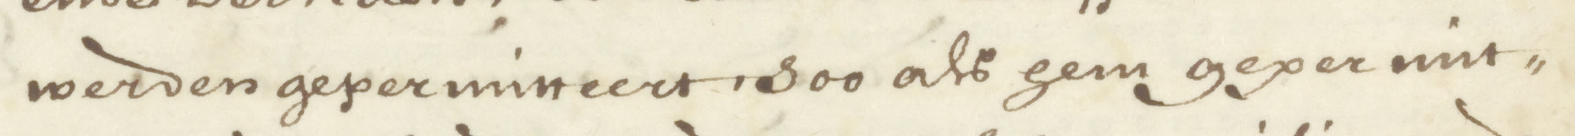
werden gepermitteert, soo als hem gepermit„
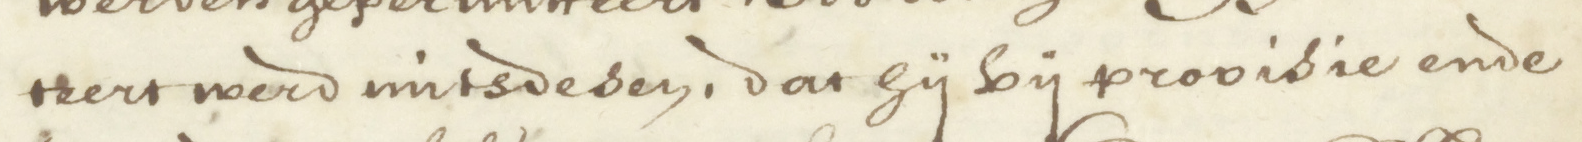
teert werd mitsdesen, dat hij bij provisie ende
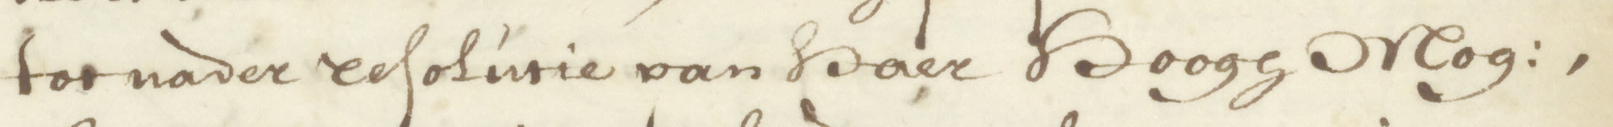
tot nader resolutie van Haer Hoogh Mog:,
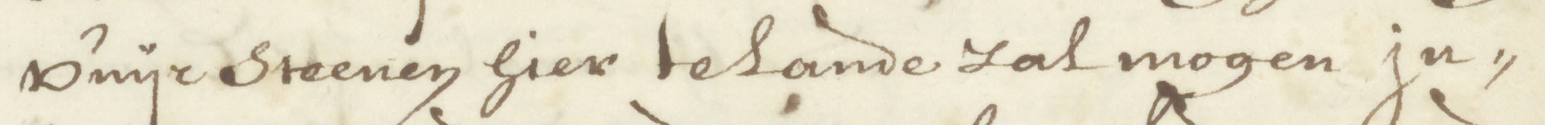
vuijrsteenen hier te lande zal mogen in„
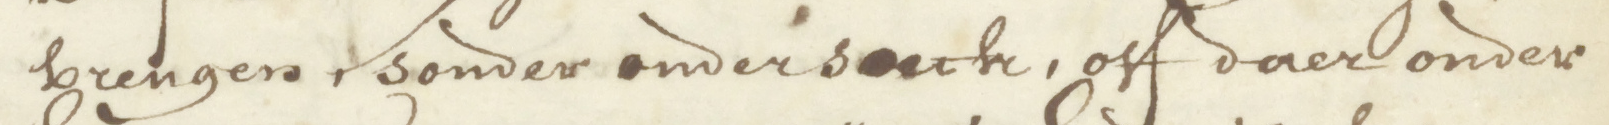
brengen, sonder ondersoeck, off daer onder
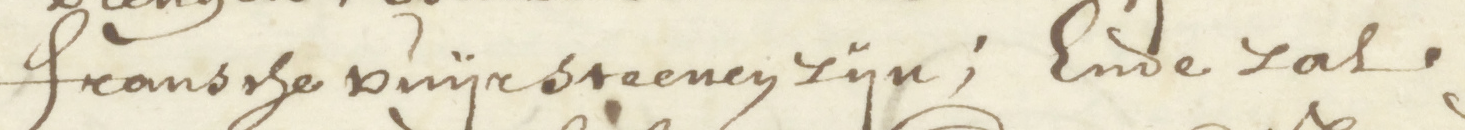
fransche vuijrsteenen zijn; Ende zal
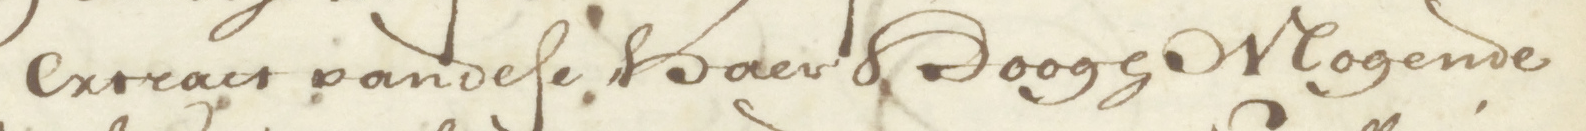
extract van dese Haer Hoogh Mogende
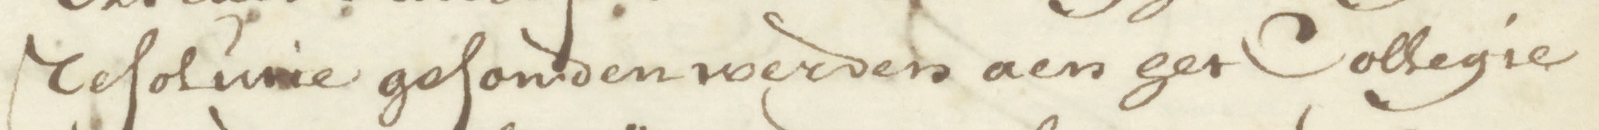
Resolutie gesonden werden aen het Collegie
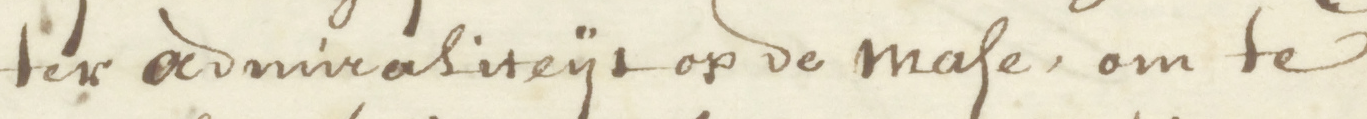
ter admiraliteijt op de Mase, om te
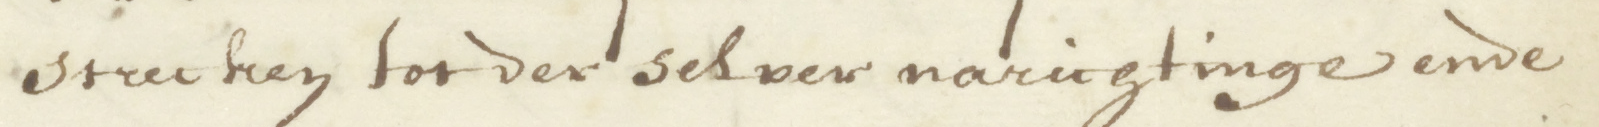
strecken tot der selver narichtinge ende
